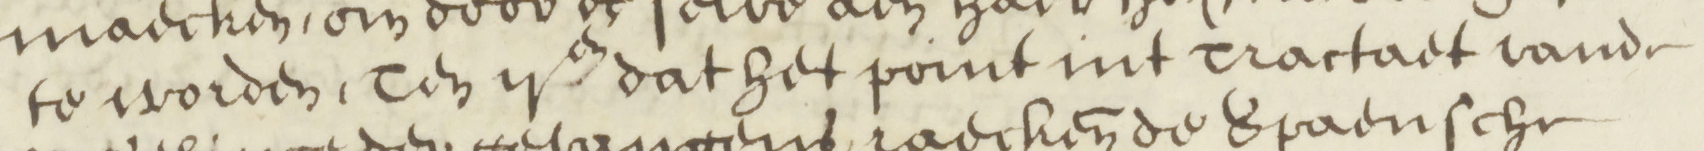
te worden. Ten ijen dat het point int Tractaet vande
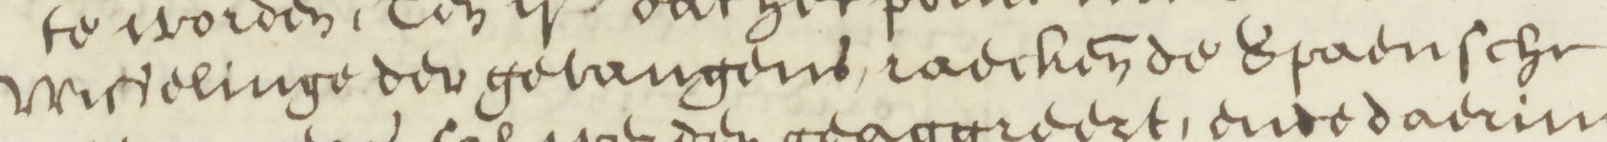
wisselinge der gevangens raecken de Spaensche
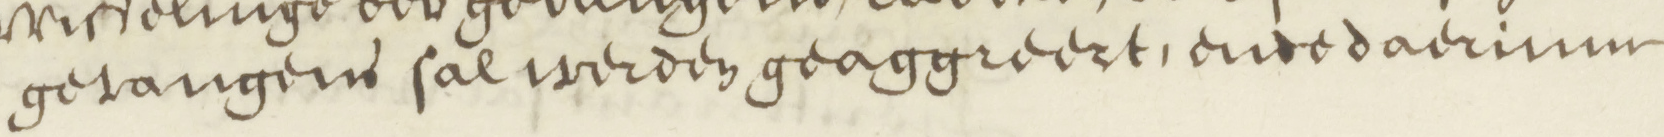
gevangens sal werden geaggreert, ende daerinne
